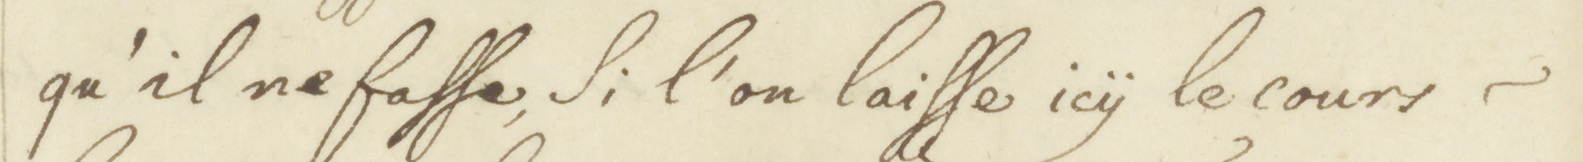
qu‛il ne fasse, si l‛on laisse icij le cours
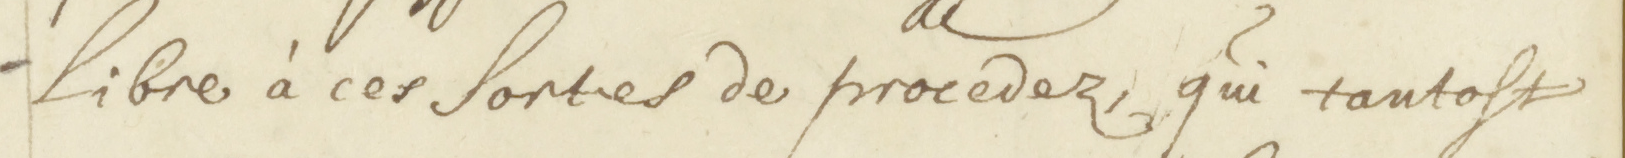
Libre á ces sortes de procedez, qui tantost
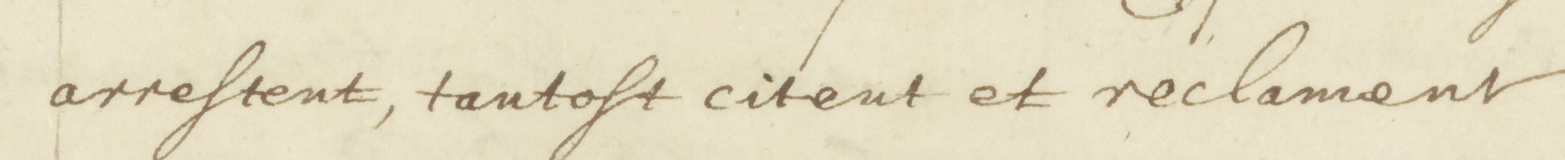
arrestent, tantost citent et reclament
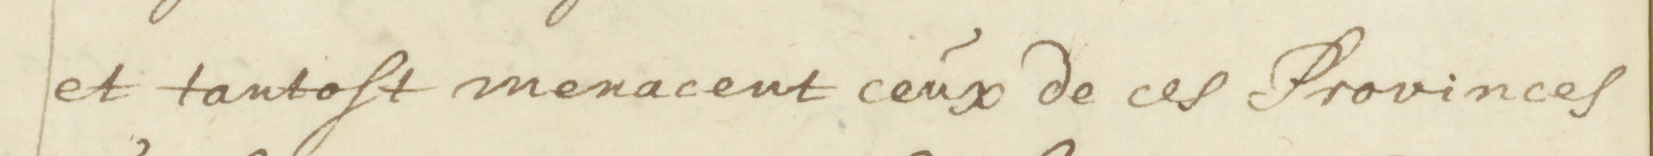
et tantost menacent ceux de ces Provinces
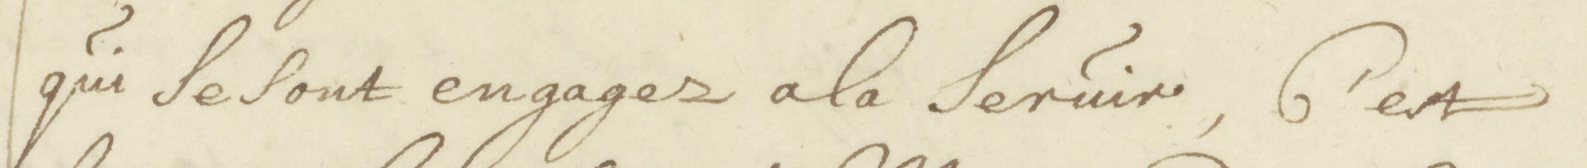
qui se sont engagez ala seruir. C‛est
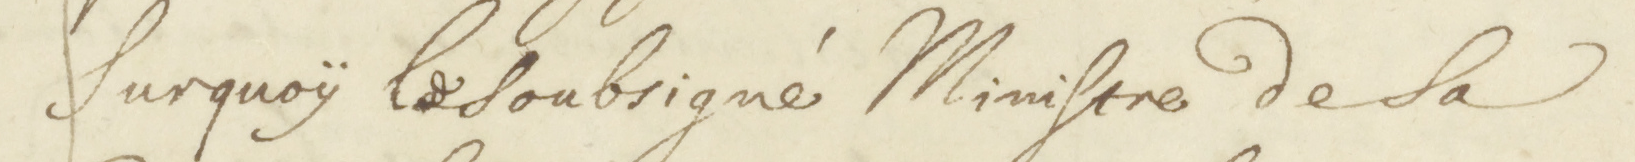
surquoij le soubsigné Ministre de sa
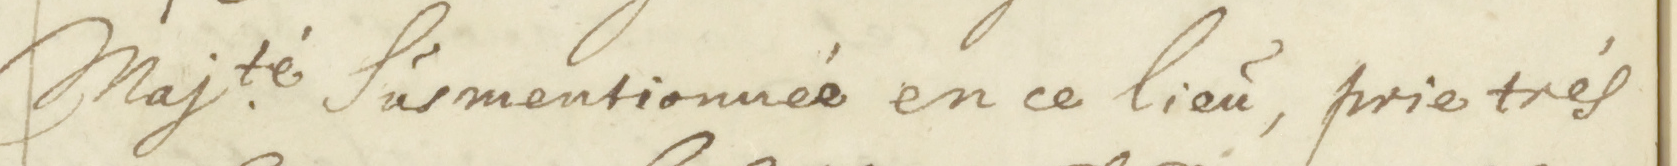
Majté. surmentionneé en ce lieu, prie trés
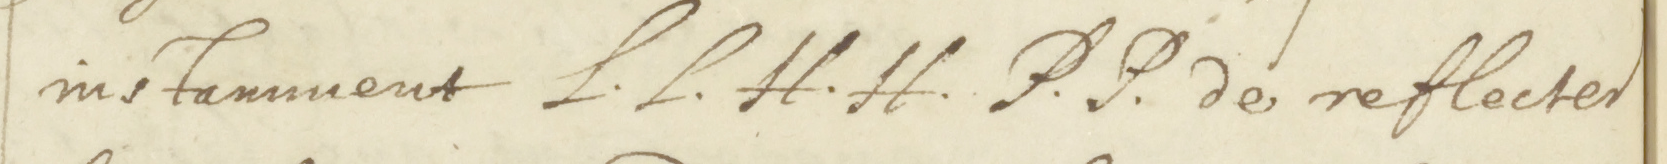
instamment L.L. H. H. P.P. de refleter
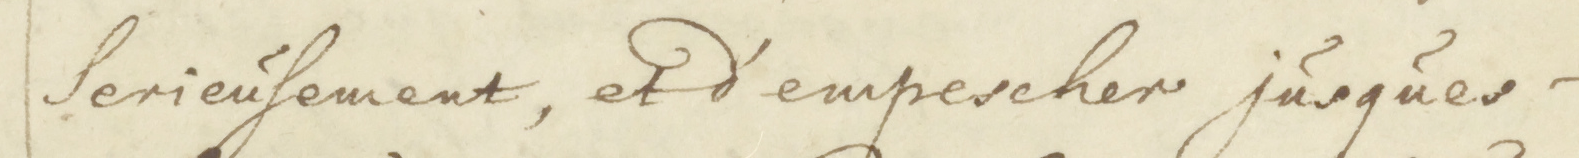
serieusement, et d'empescher jusques
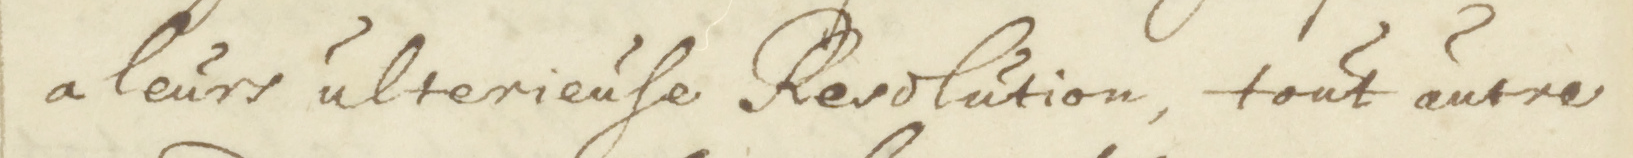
a leurs ulterieuse Resolutien, tout autre
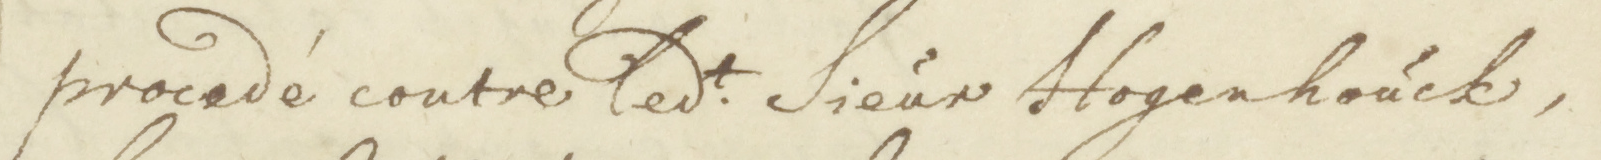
procedé contre ledt. sieur Hogenhouck.
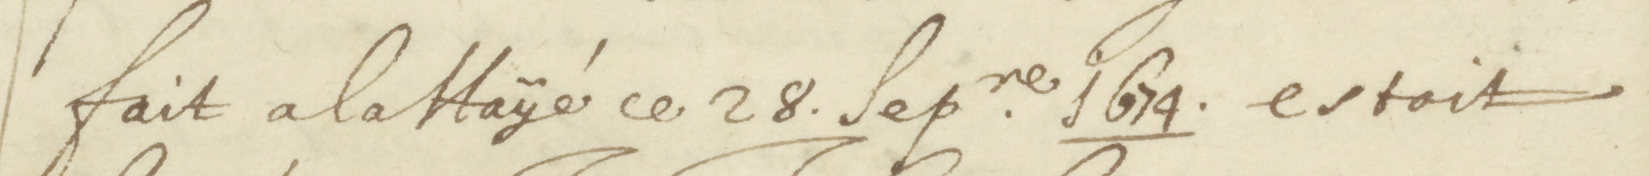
fait a la Haijé ce 28. Sepre. 1674. estoit
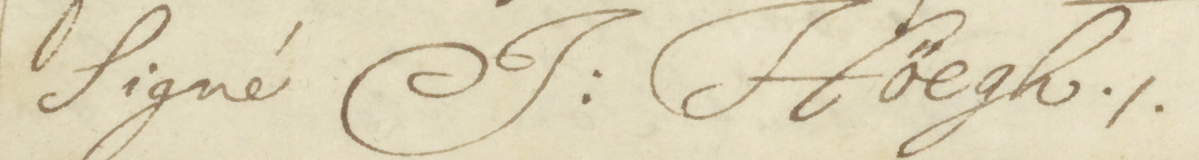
signé J: Höegh.
